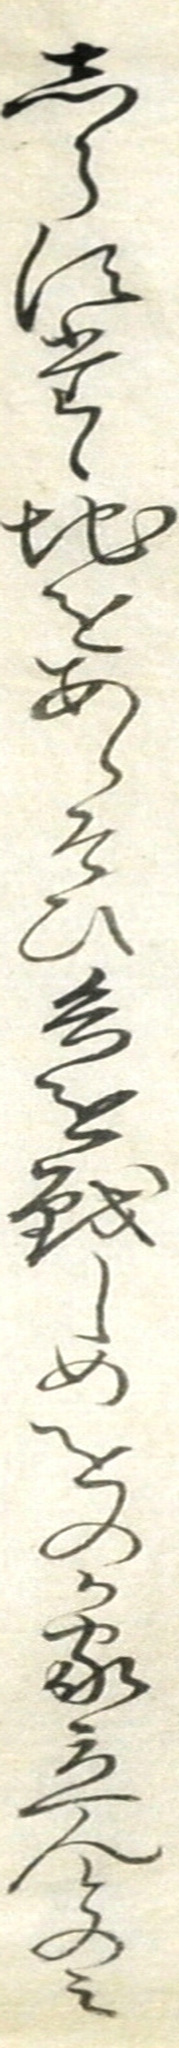しらすたゝ地をあらそひ兵を戦しめをのか家立んとのみ
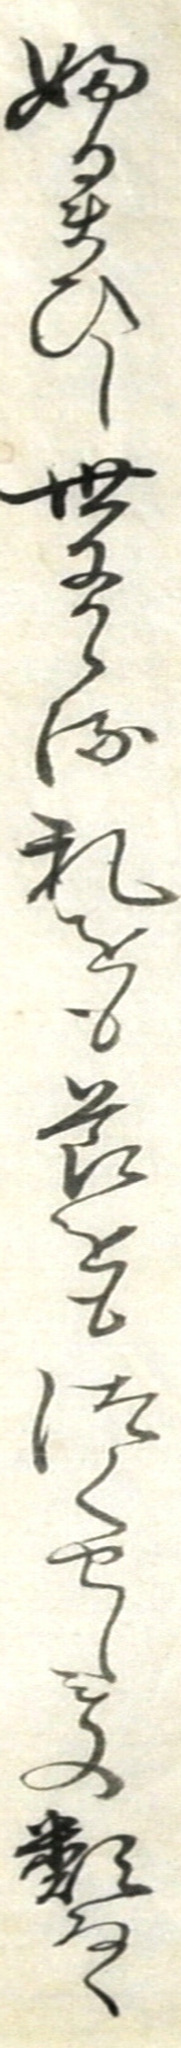ふるまひし世にかゝる礼をも節をもつくせしもの類なく
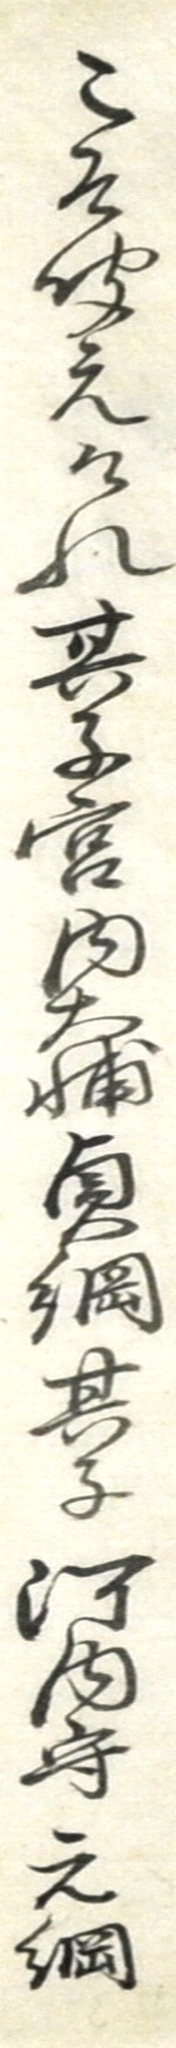こそ聞えけれ其子宮内大輔貞綱其子河内守元網
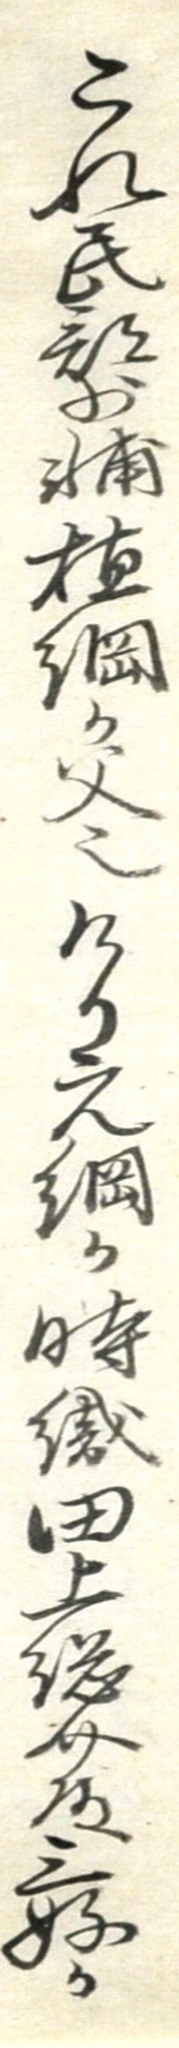これ民部少輔植綱か父也けり元網か時織田上総介殿三好か
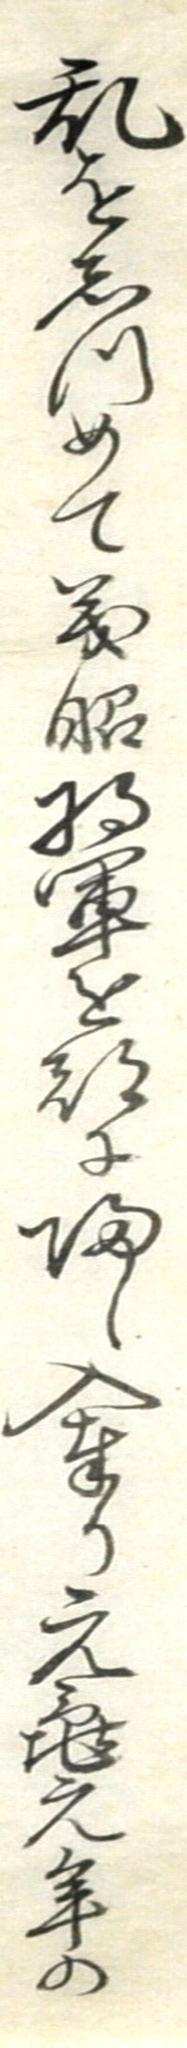乱をしつめて義昭将軍を都に帰し入奉り元亀元年の
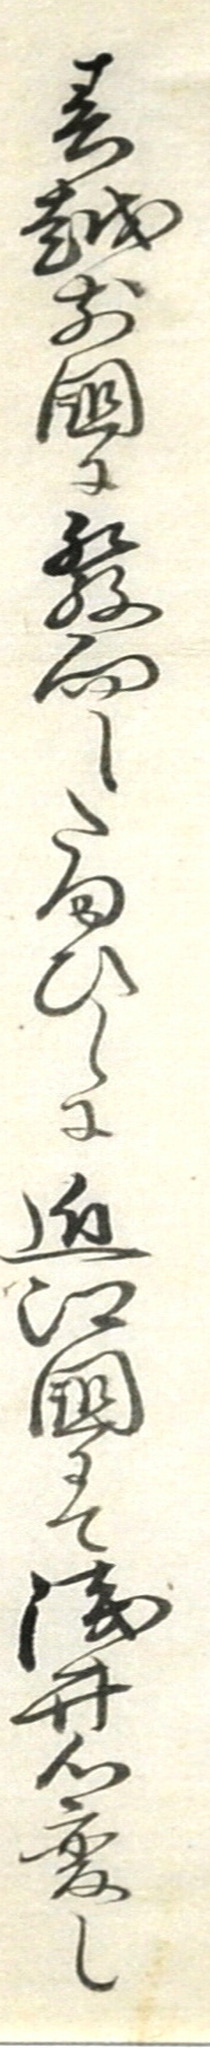春越前国に発向したまひしに近江国にて浅井心変し
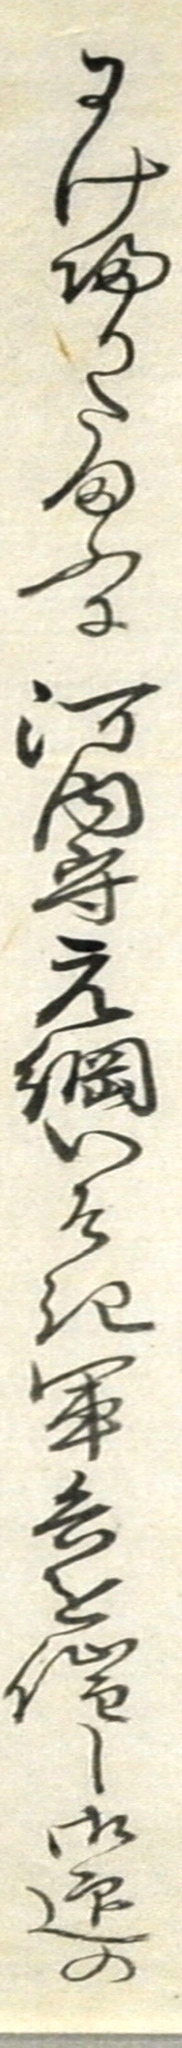にけ帰りたまふに河内守元網いそき軍兵を催し御迎の
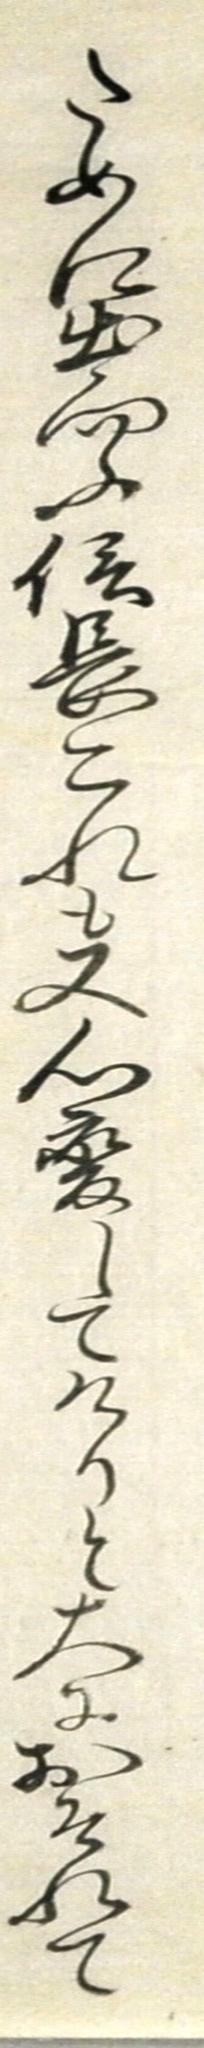ために出向ふ信長これも又心変してけりと大におそれて
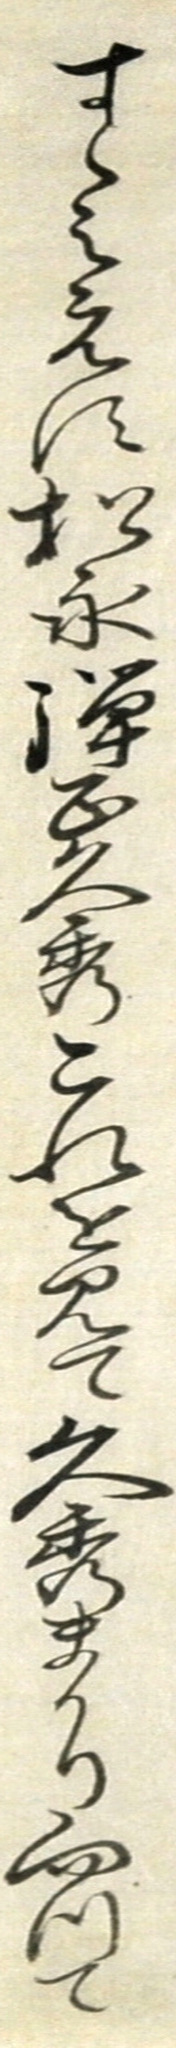すゝみえす松永禅正久秀これを見て久秀まかり向つて
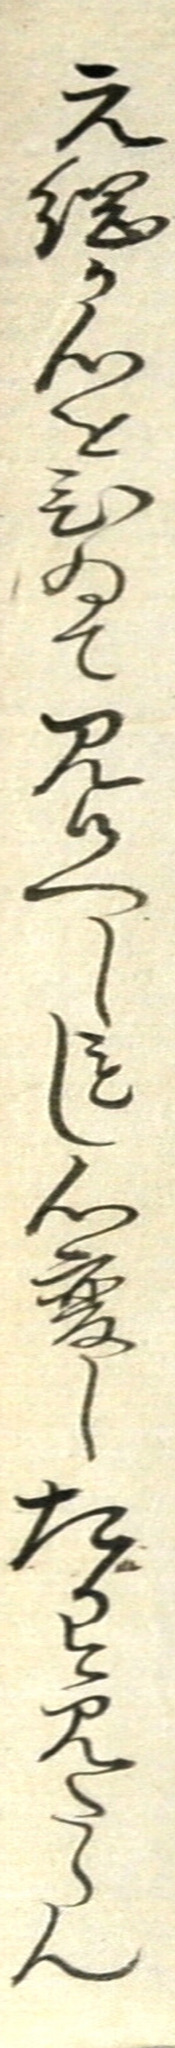元網か心をひゐて見候へしもし心変したりと見たらん

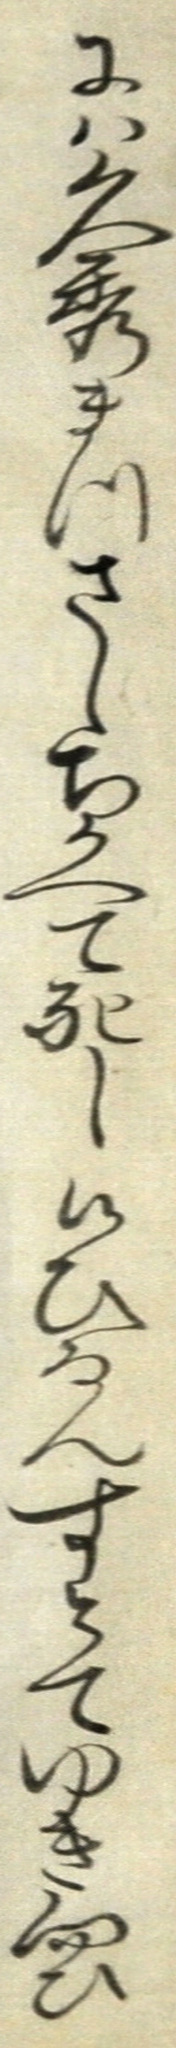には久秀まつさしちかへて死し候ひなんすとてゆき向ひ
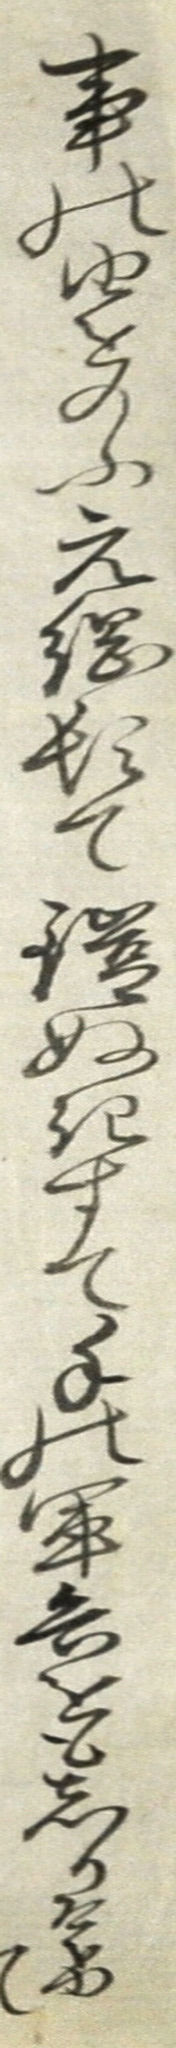事の由をのふ元網頓て鎧ぬきすて手の軍兵をもしりそけて
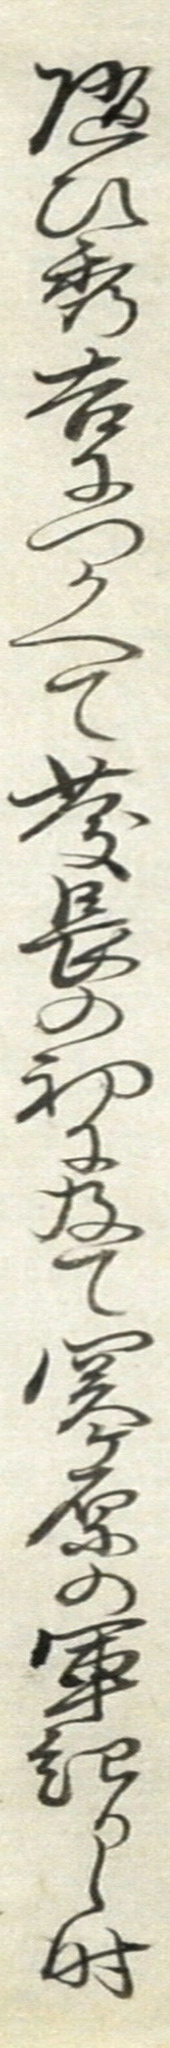随ひ秀吉につかへて慶長の初に及て関ヶ原の軍起りし時
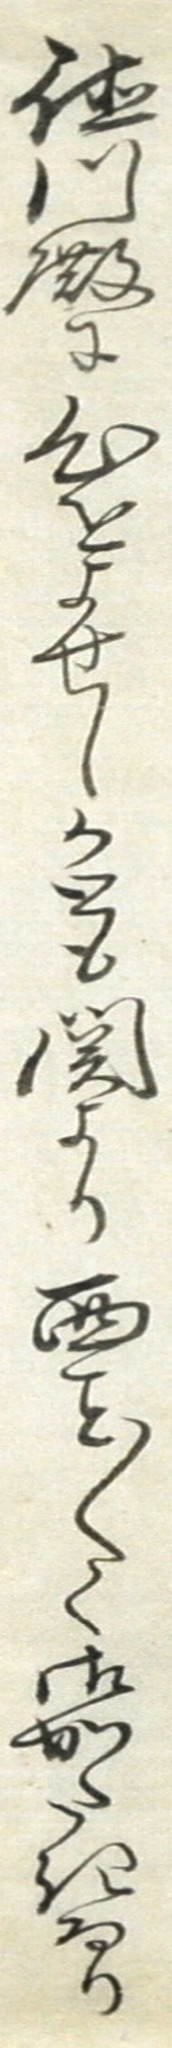徳川殿に心をよせしかとも関より西こと〳〵く御かたきなり
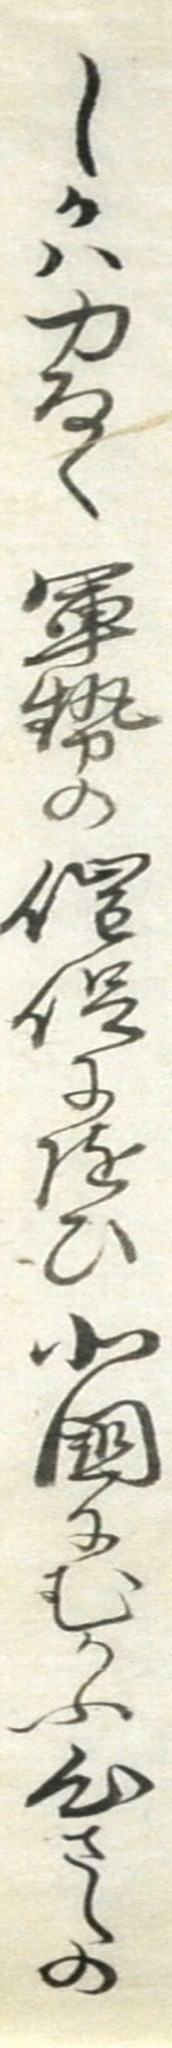しかは力なく軍勢の催促に随ひ北国にむかふ心さしの
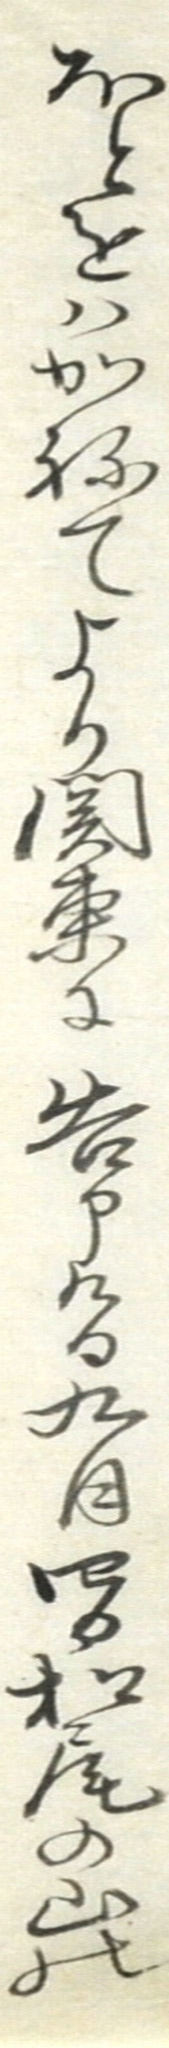ほとをはかねてより関東に告申ける九月四日松尾の山の
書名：藩翰譜（六）
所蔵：伊那市立高遠町図書館・合同会社AMANE
